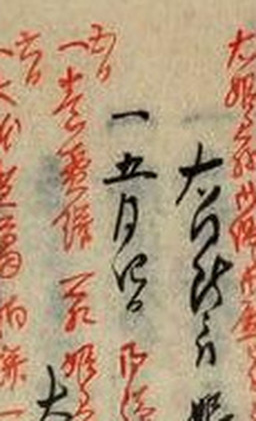一五月朔日
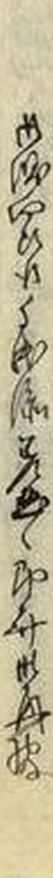御側向頭取へ手紙添差出候即刻御再報
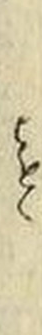被供之
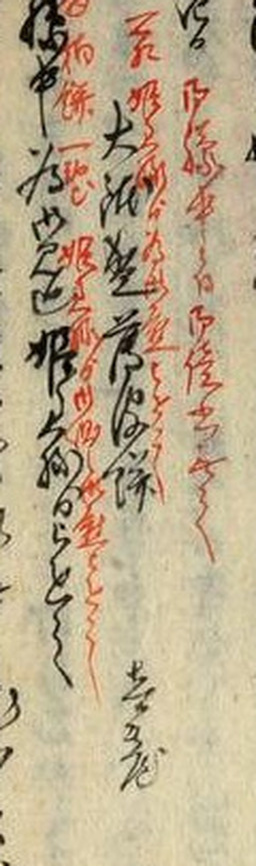大鉢盛薄皮餅壱台
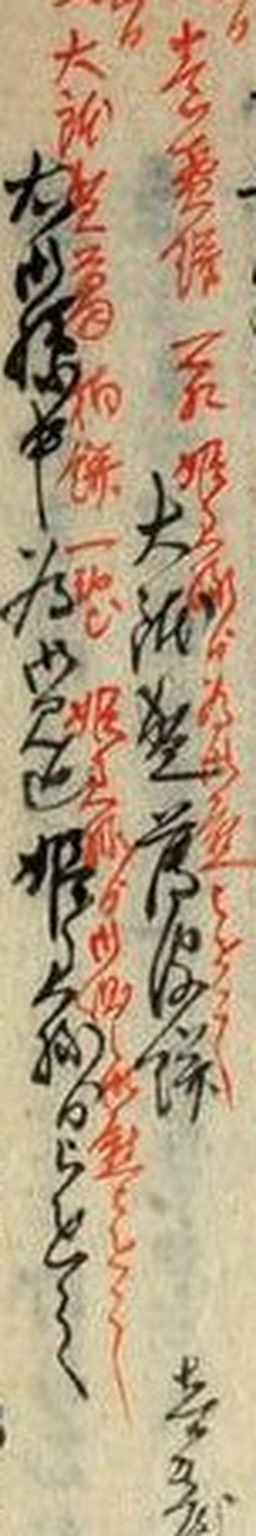右御朦中為御見廻姫君様ゟ被進之
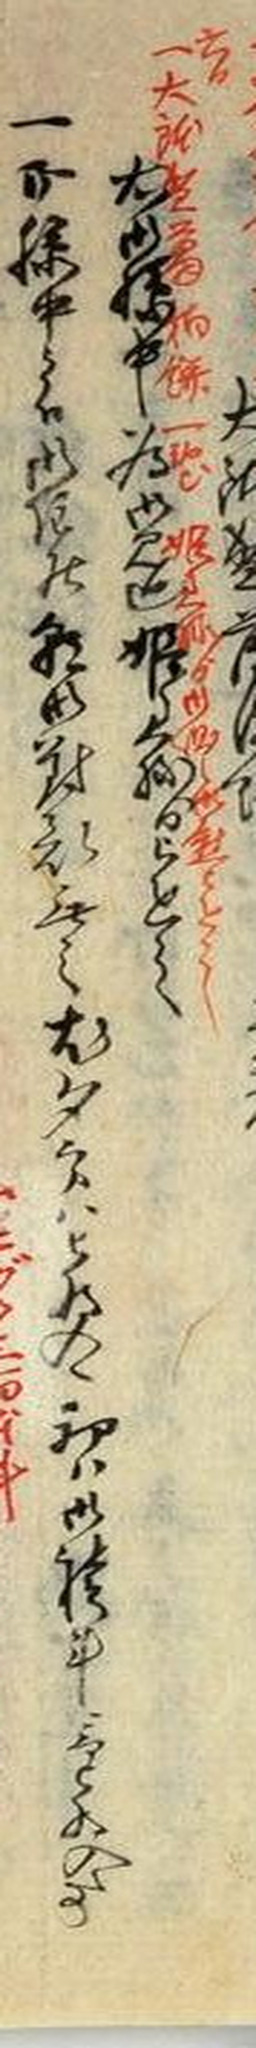一御朦中ニ付御住居朝御対顔無之尤夕方ハ被為入候初ハ御袴斗二而被為入候事
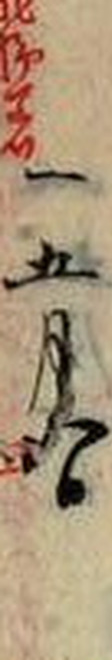一五月八日
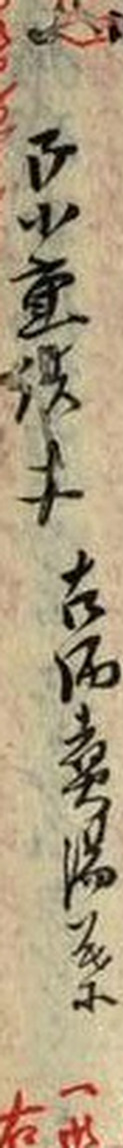御小重詰十古酒煮湯葉

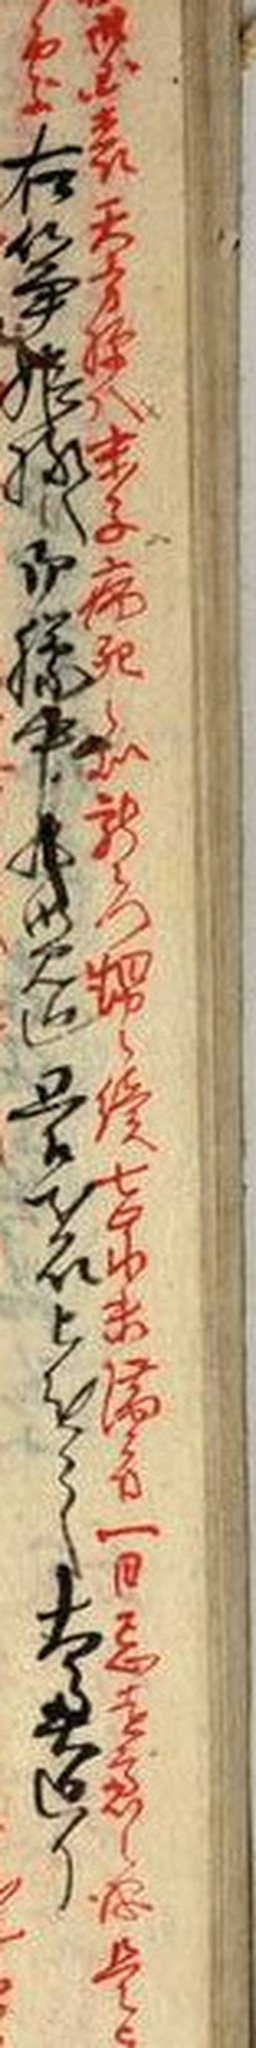右箏姫様へ御朦中為御見廻思召を以被進之大奥廻り
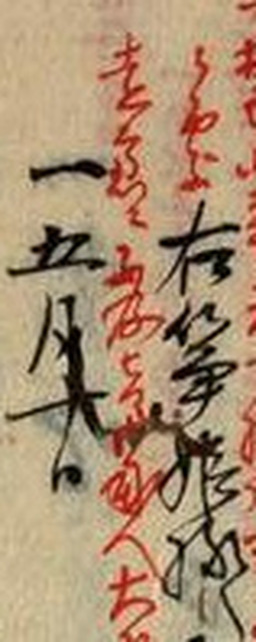一五月廿日
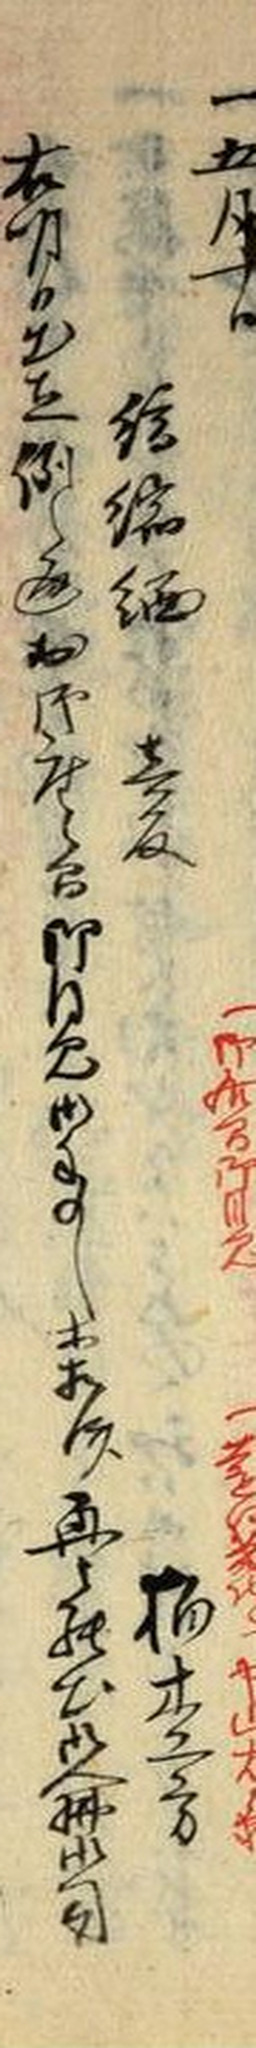右明日出立例之通於御座之間御目見御手のし等相済再被罷出御人払御用
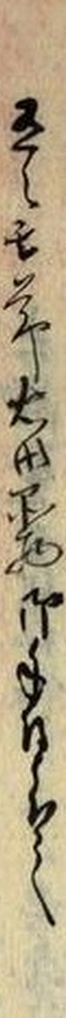有之其節右御品物御手自被下之
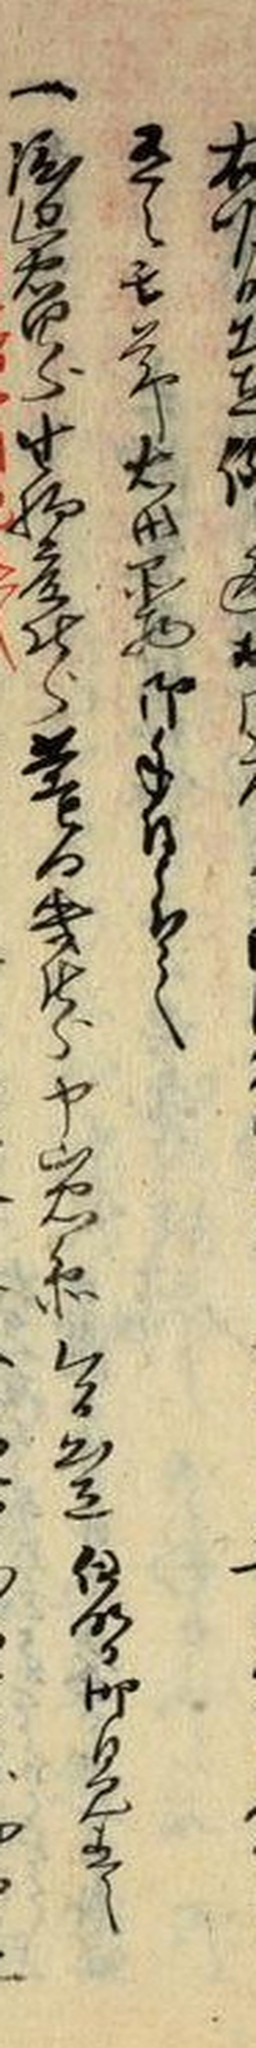一渡辺忠四郎生駒藤次郎薗田幾次郎中山忠兵衛今日出立但昨日御目見有之
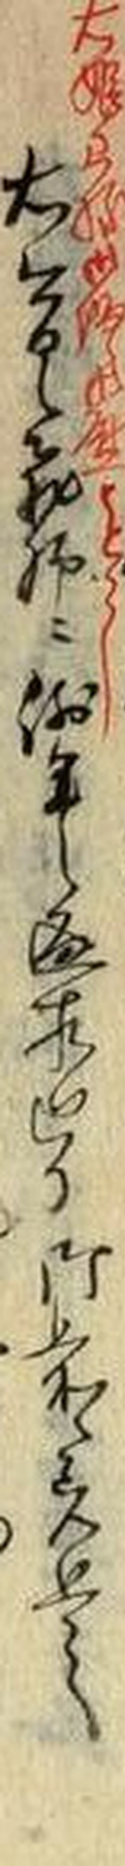右今日之飛脚ニ例年之通相廻り御前へ差上之
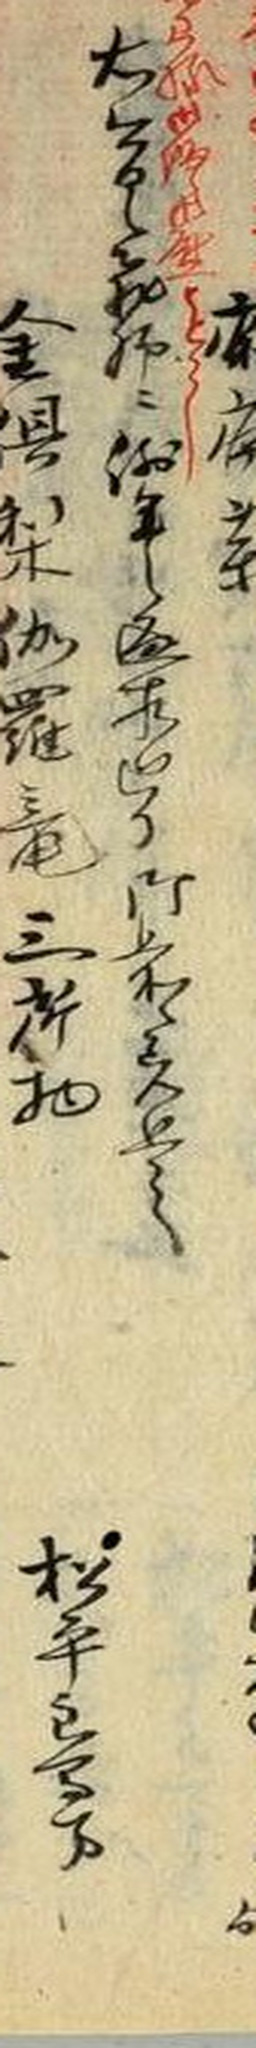金俱梨伽羅竜三所物松平主馬方
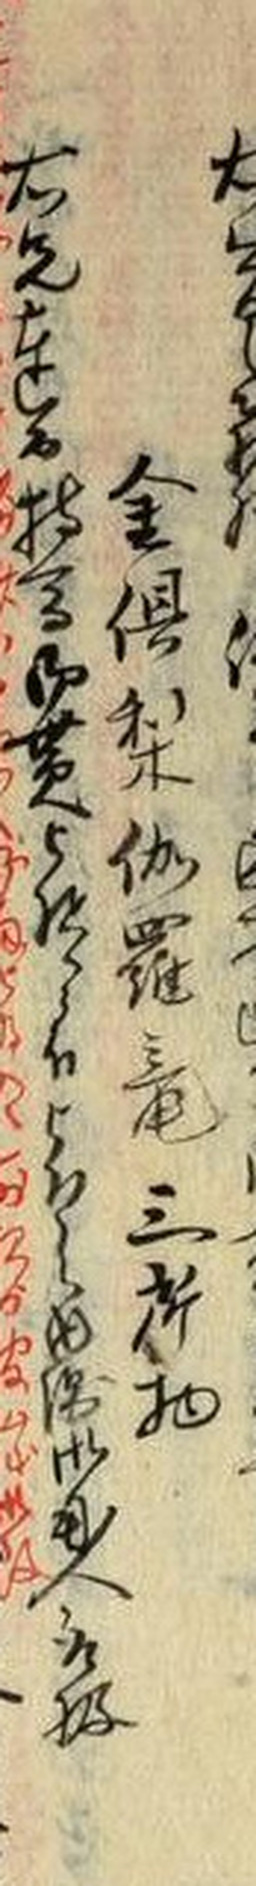右先達而持馬御貰被遊候ニ付被下之御側御用人取扱
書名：少傅日録抄（斉承付側向頭取日記、在府）
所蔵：福井県文書館 Fukui Prefectural Archives
